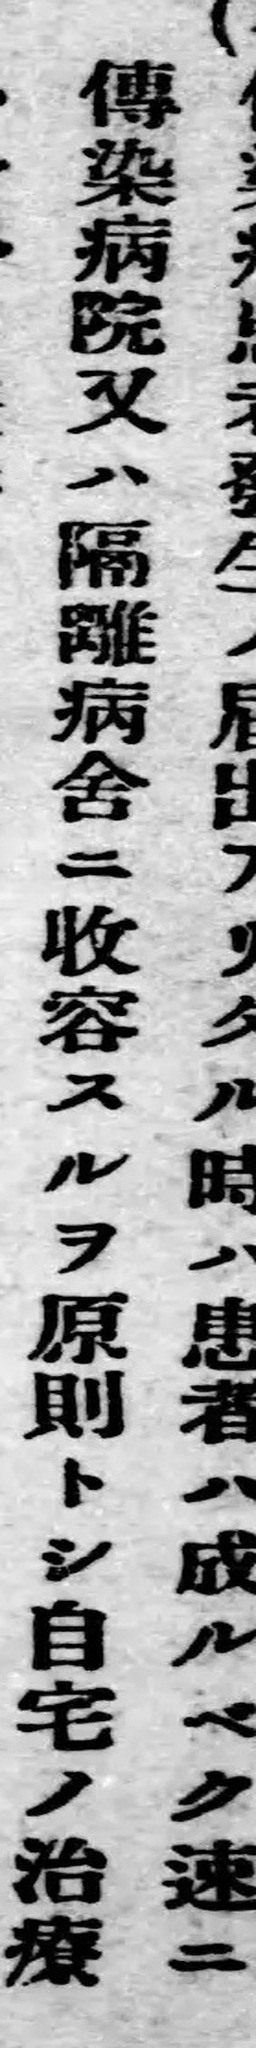傅染病院又ハ隔離病舎ニ収容スルヲ原則トシ自宅ノ治療
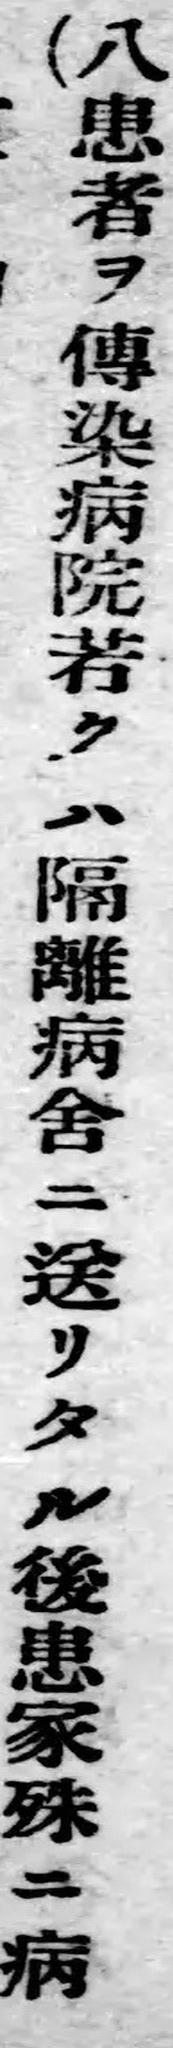(八)患者ヲ傅染病院若クハ隔離病舎ニ送リタル後患家殊ニ病
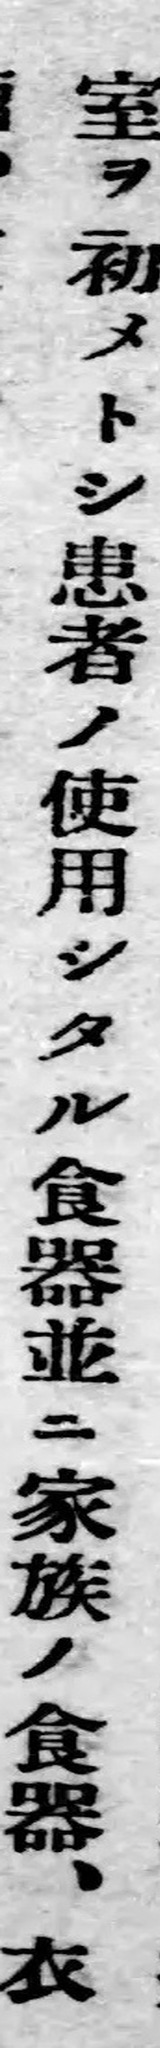室ヲ初メトシ患者ノ使用シタル食器並ニ家族ノ食器、衣
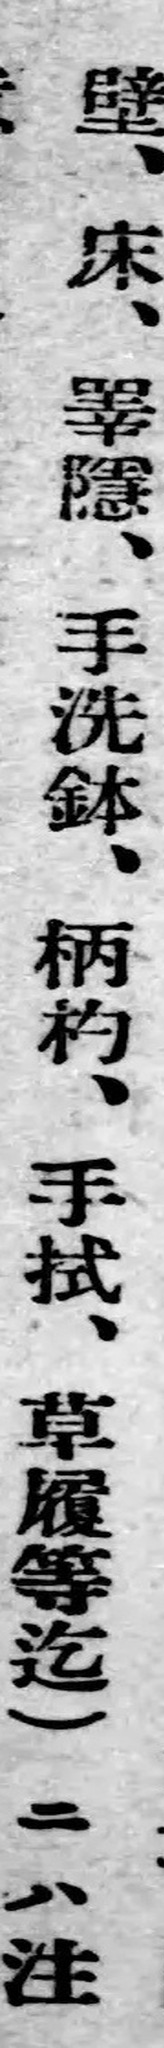壁、床、睪隱、手洗鉢、柄杓、手拭、草履等迄)ニハ注
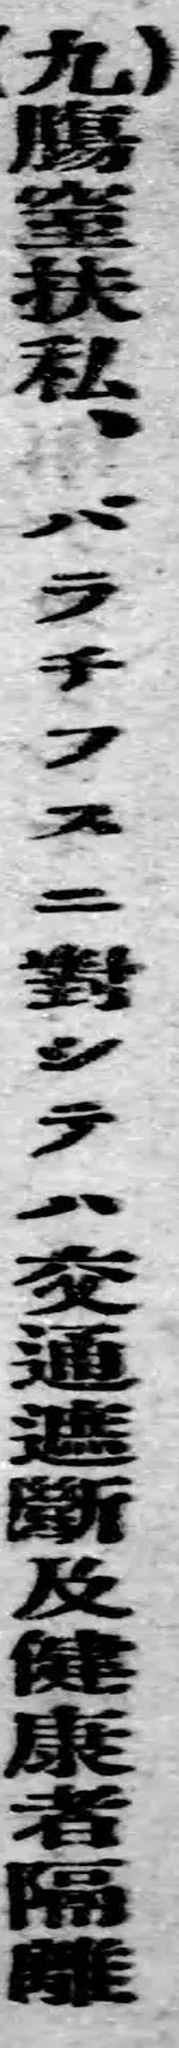(九)腸窒扶私、パラチフスニ對シテハ交通遮斷及健康者隔離
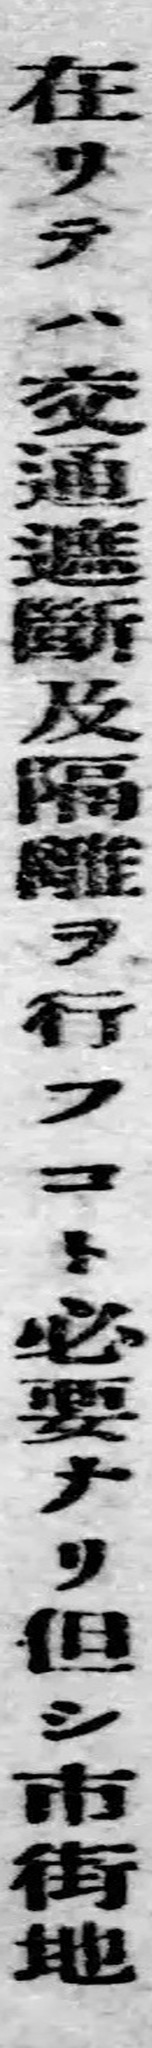在リテハ交通遮斷及隔離ヲ行フコト必要ナリ但シ市街地
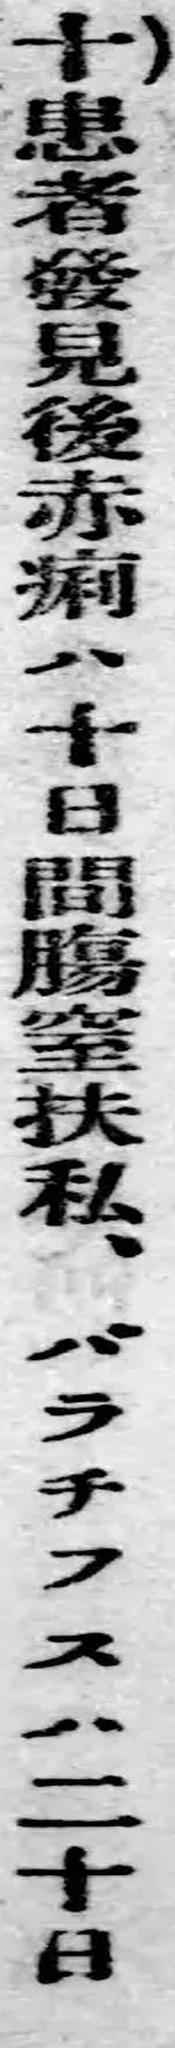(十)患者發見後赤痢ハ十日間腸窒扶私、パラチフスハ二十日
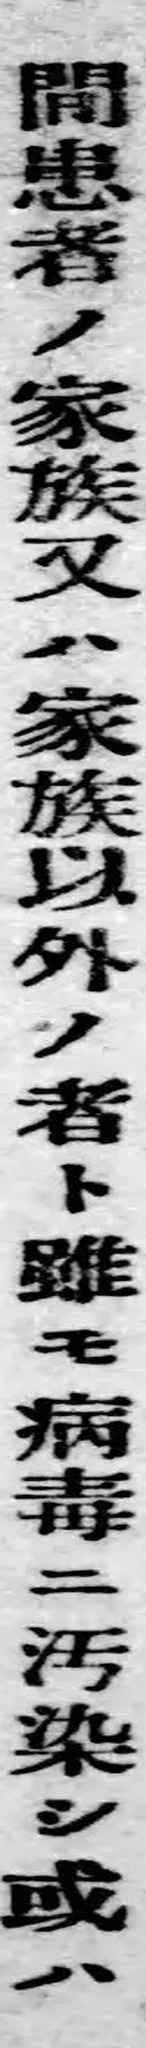間患者ノ家族又ハ家族以外ノ者ト雖モ病毒ニ汚染シ或ハ
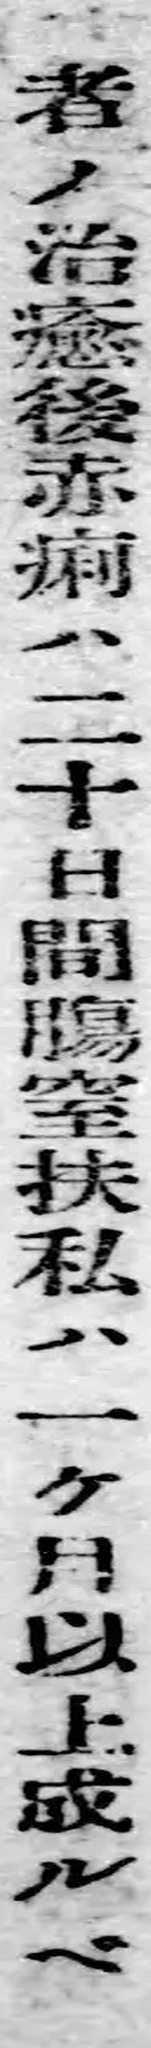者ノ治癒後赤痢ハ二十日間腸窒扶私ハ一ヶ月以上成ルベ
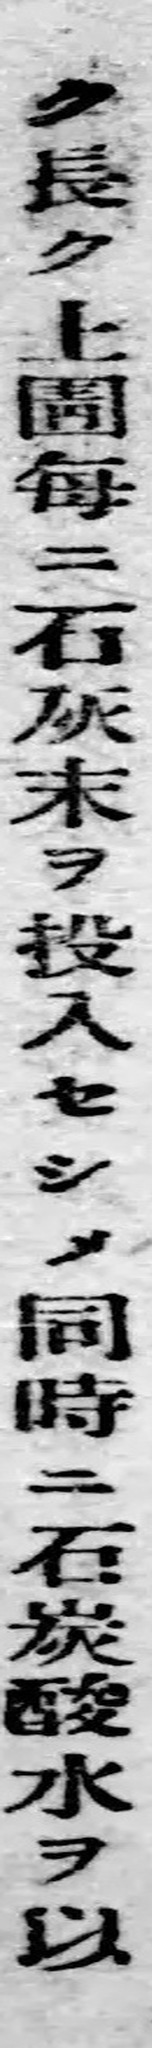ク長ク上圊毎ニ石灰末ヲ投入セシメ同時ニ石炭酸水ヲ以
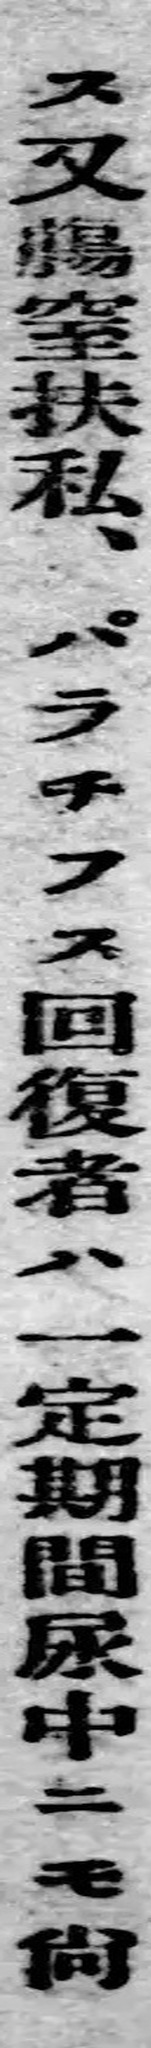ス又腸窒扶私、パラチフス回復者ハ一定期間尿中ニモ尚

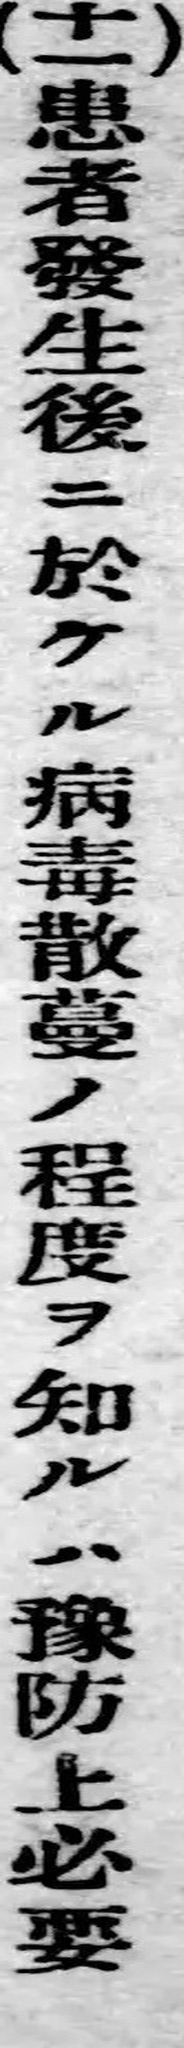(十一)患者發生後ニ於ケル病毒散蔓ノ程度ヲ知ルハ豫防上必要
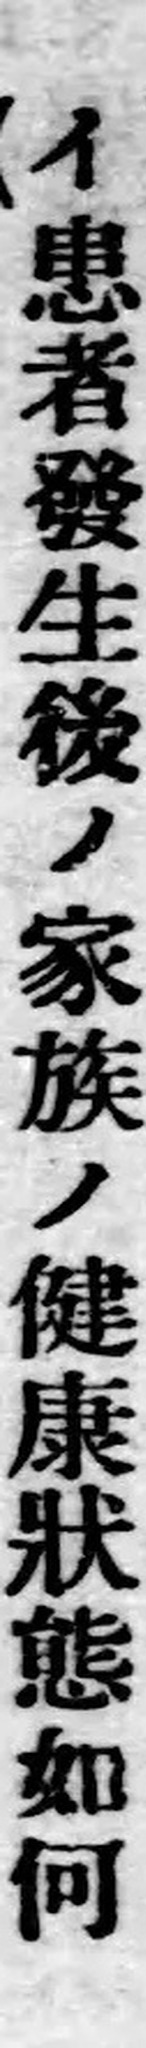(イ)患者發生後ノ家族ノ健康狀態如何
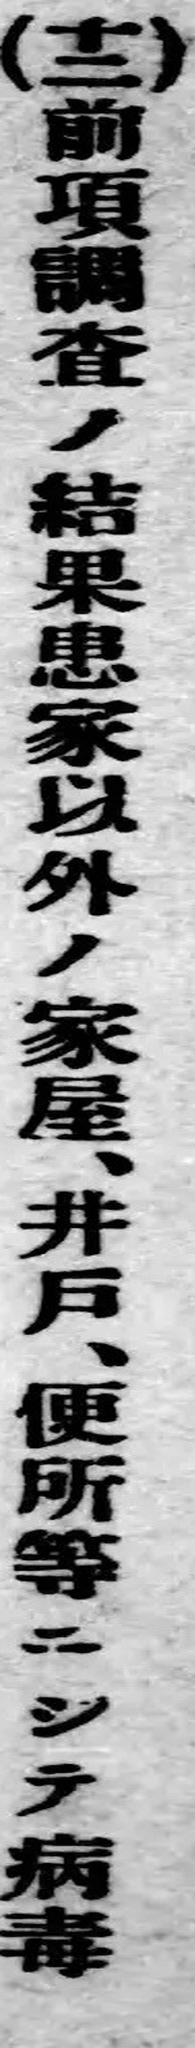(十二)前項調査ノ結果患家以外ノ家屋、井戸、便所等ニシテ病毒
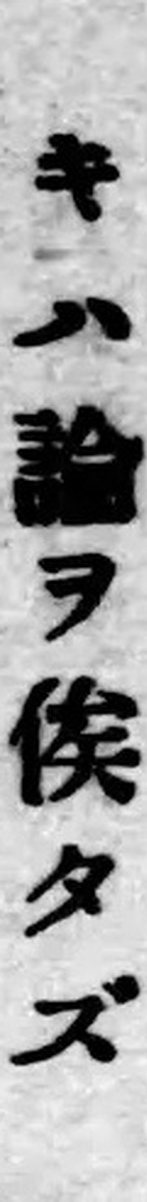キハ論ヲ俟タズ
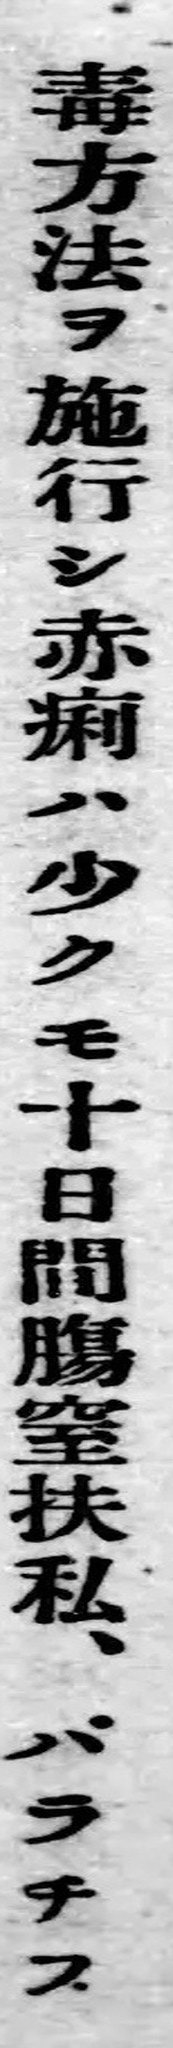毒方法ヲ施行シ赤痢ハ少クモ十日間膓窒扶私、パラチフ
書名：袖珍防疫必携
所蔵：国立国会図書館 National Diet Library, JAPAN
